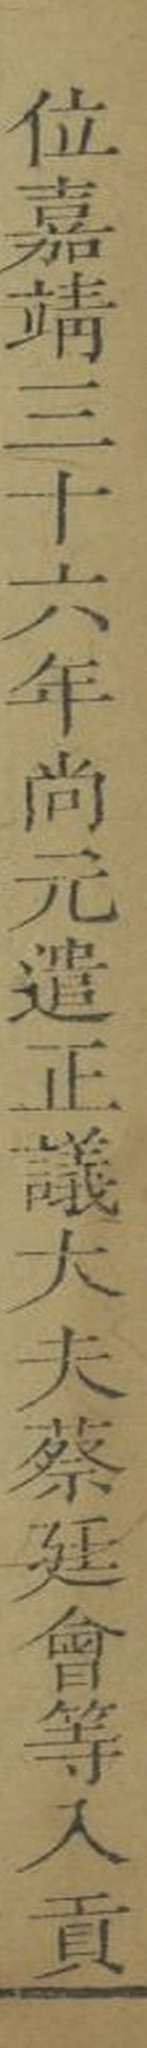位嘉靖三十六年尚元遣正議大夫蔡廷会等入貢
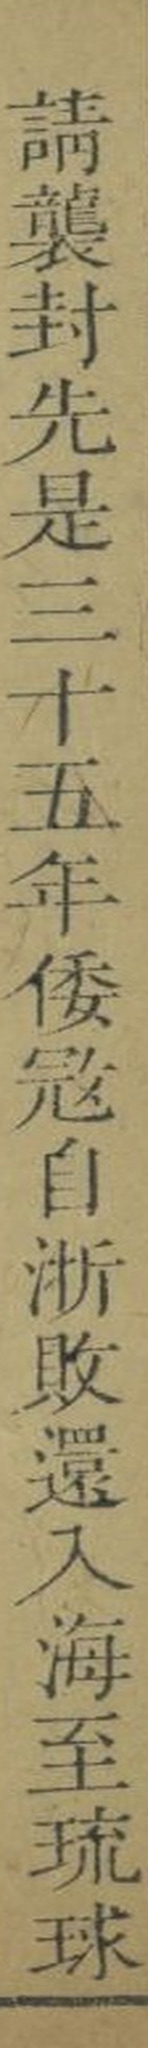請襲封先是三十五年倭寇自浙敗還入海至琉球
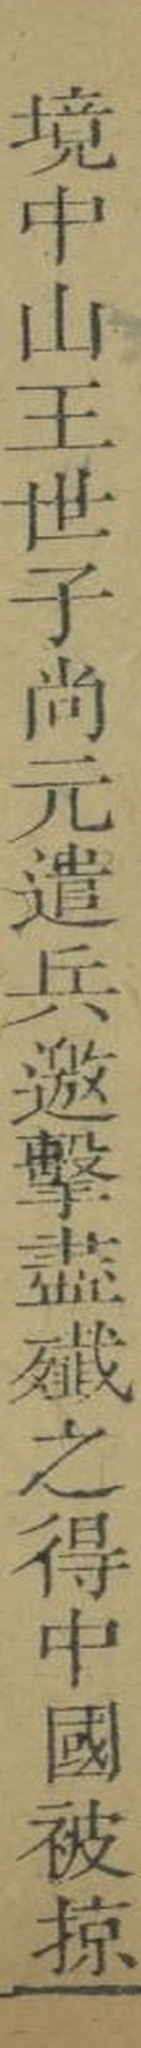境中山王世子尚元遣兵邀撃尽殲之得中国被掠
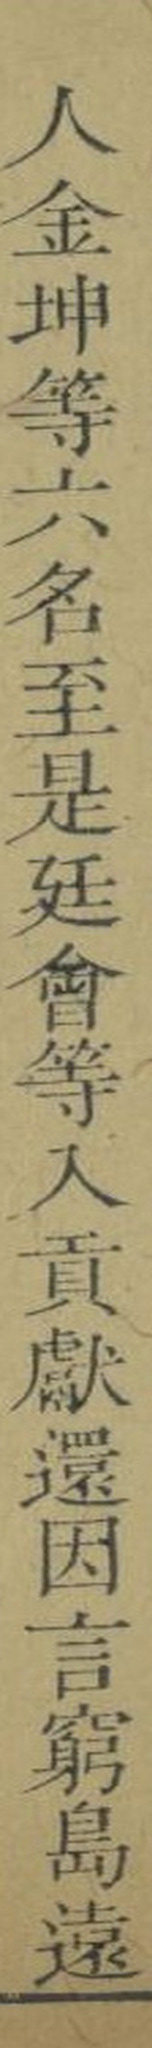人金坤等六名至是廷会等入貢献還因言窮島遠
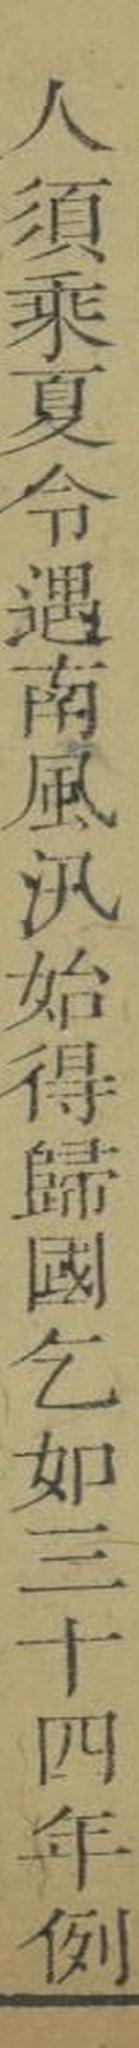人須乗夏令遇南風汛始得帰国乞如三十四年例
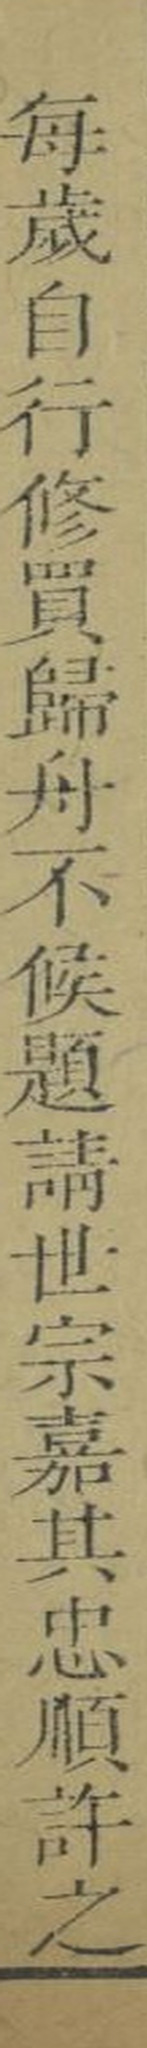毎歳自行修買帰舟不候題請世宗嘉其忠順許之
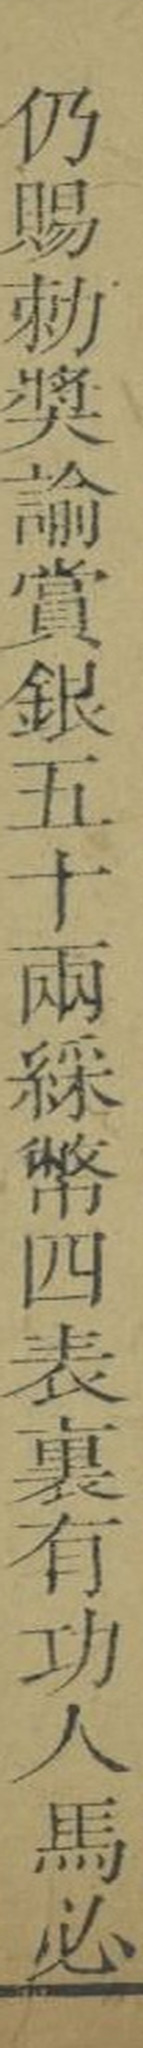仍賜勅奨諭賞銀五十両綵幣四表裏有功人馬必
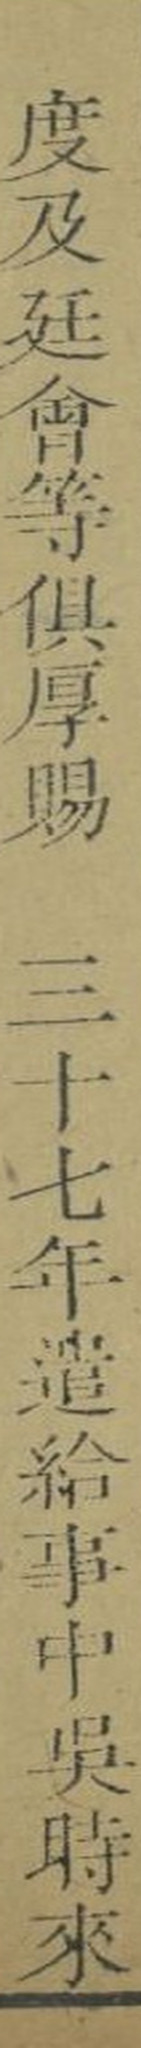度及廷会等俱厚賜三十七年遣給事中呉時来
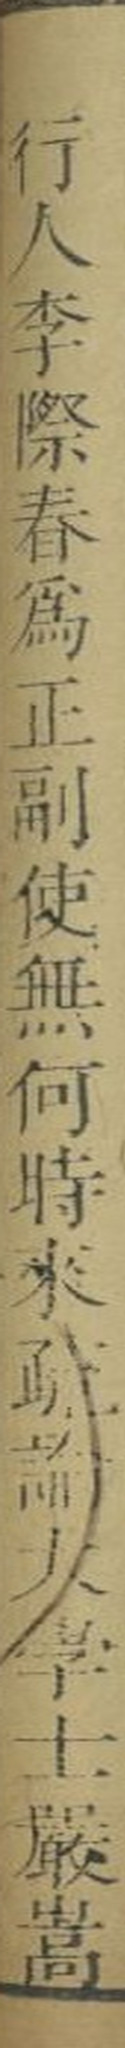行人李際春為正副使無何時来疏論大学士巌嵩
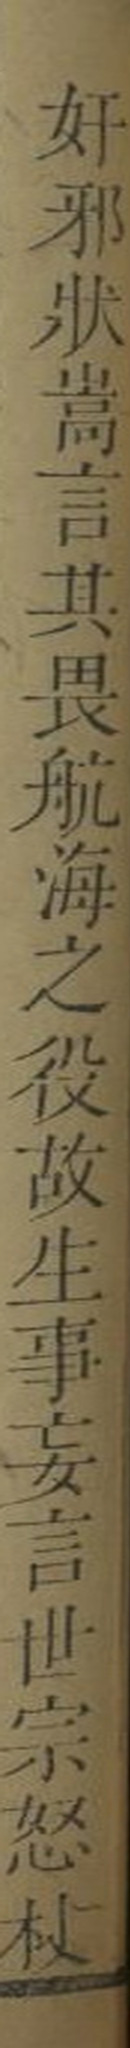奸邪状嵩言其畏航海之役故生事妄言世宗怒杖
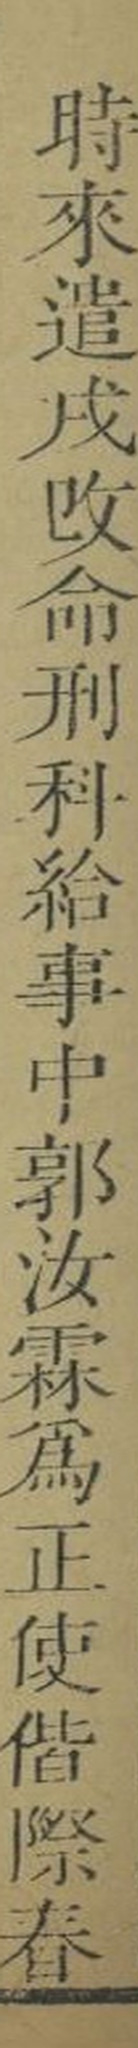時来遣戌改命刑科給事中郭汝霖為正使偕際春
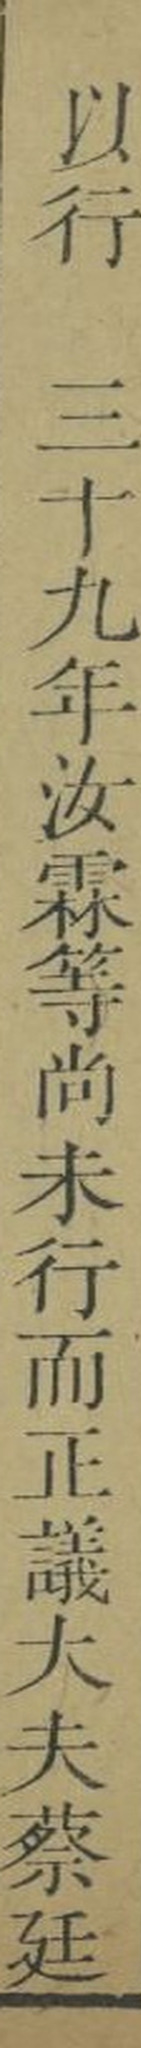以行三十九年汝霖等尚未行而正議大夫蔡廷
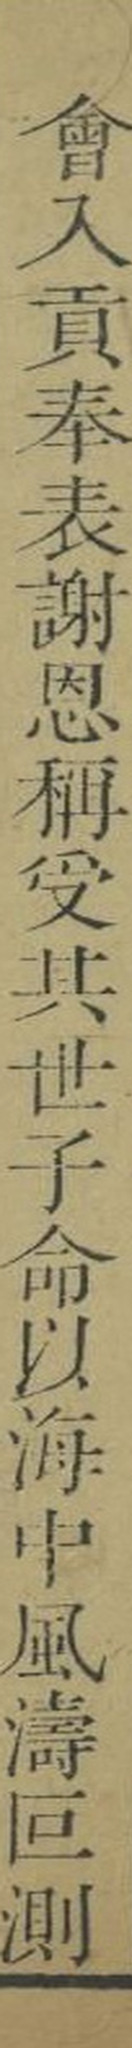会入貢奉表謝恩称受其世子命以海中風濤叵測
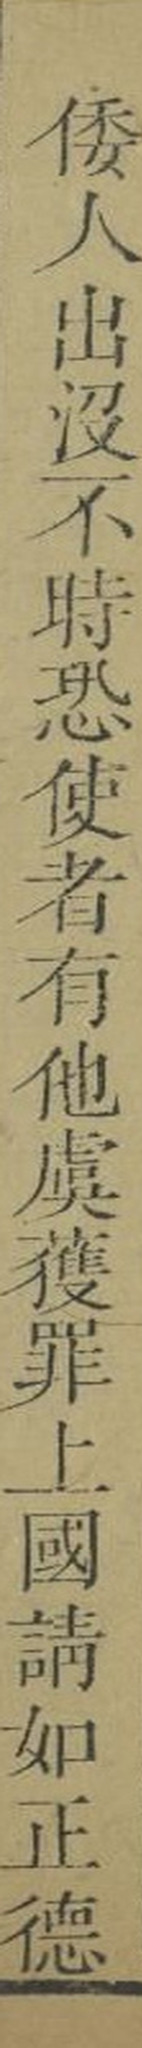倭人出没不時恐使者有他虞獲罪上国請如正徳
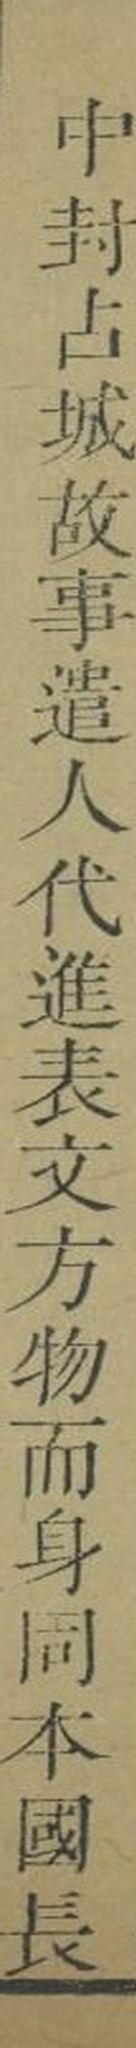中封占城故事遣人代進表文方物而身同本国長
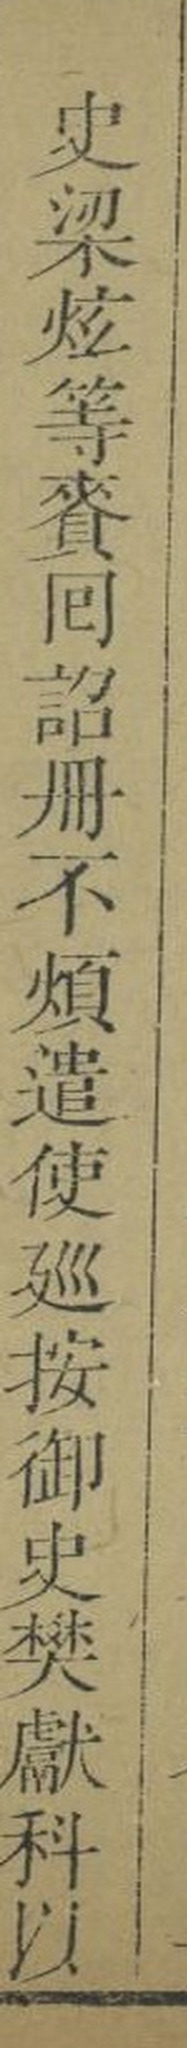史梁炫等賚回詔冊不煩遣使巡按御史焚献科以
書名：中山伝信録 巻三
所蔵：University of the Ryukyus Library
